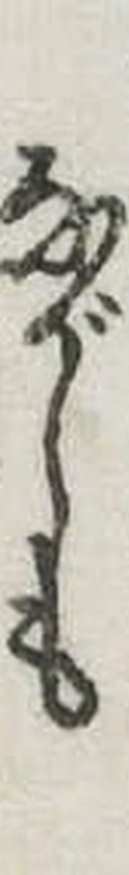ながしも
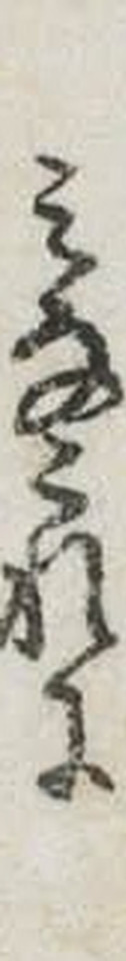みなこれに
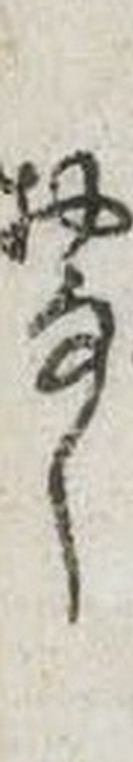おなし
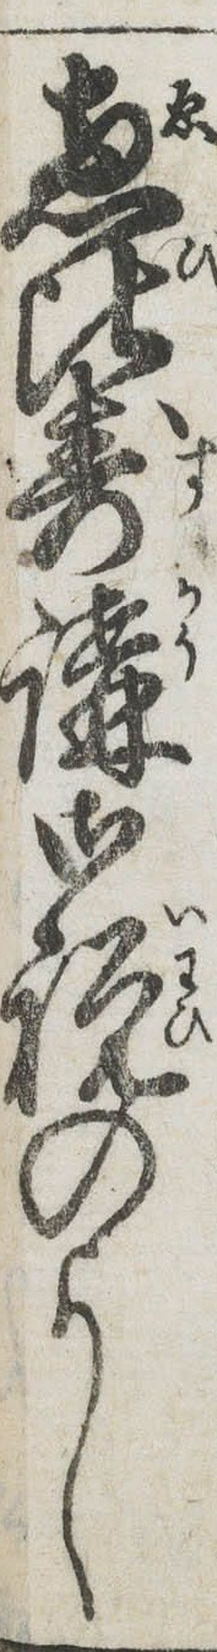恵比寿講御祝のよし
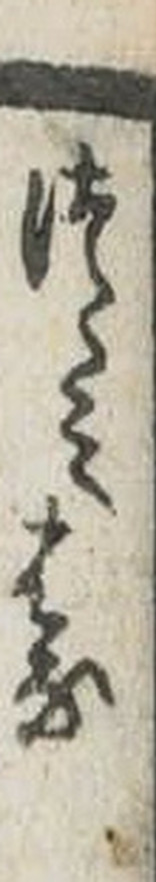つゝみはな
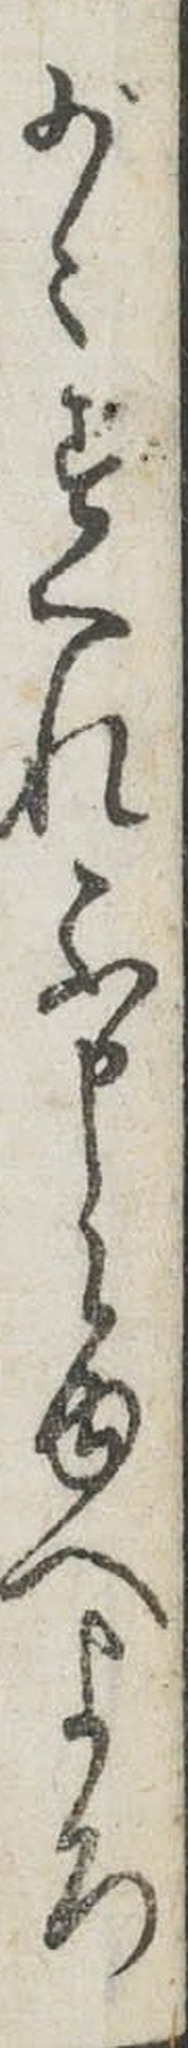少々すくれ不申候ゆへよろ
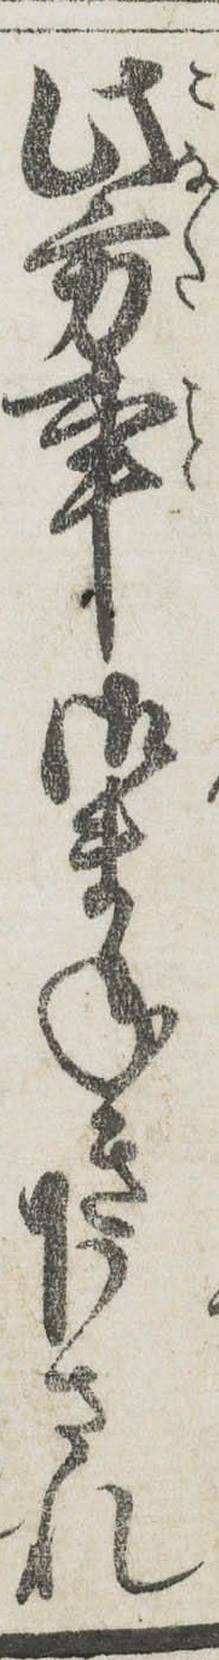此方事御まねき下され
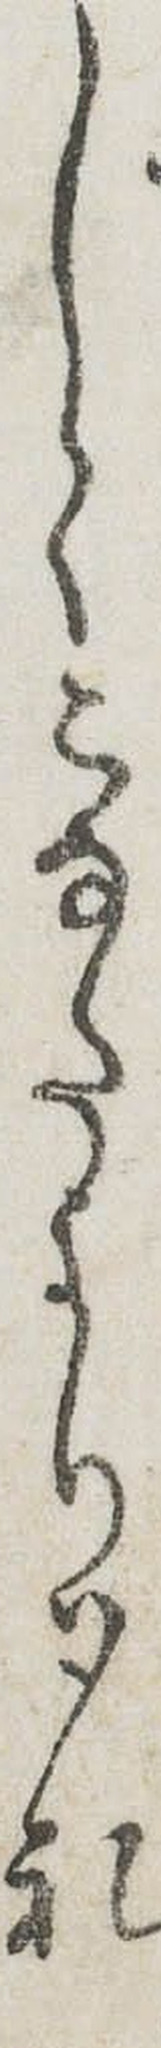しくこなたより御礼
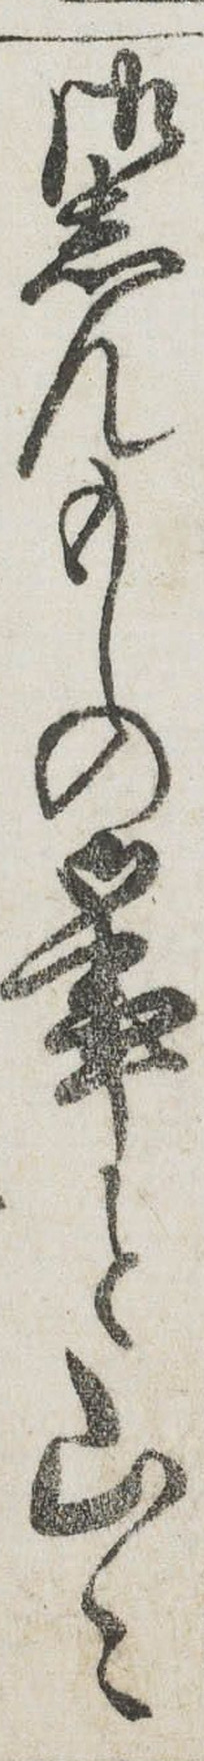御しんもしの御事と山々
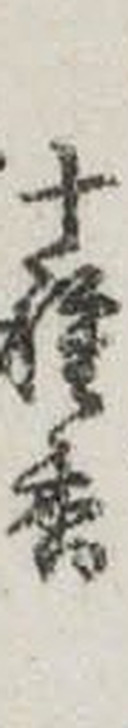十種香
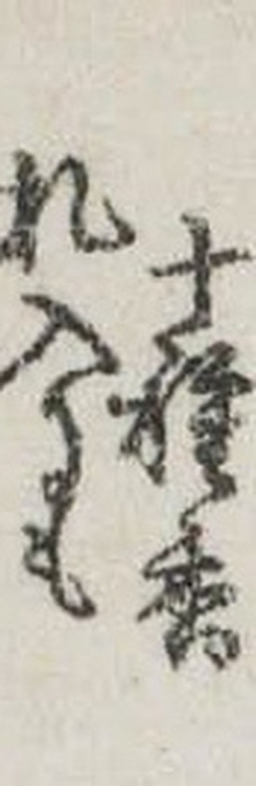札入にも
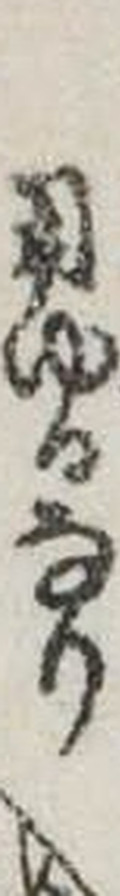用ゆるなり
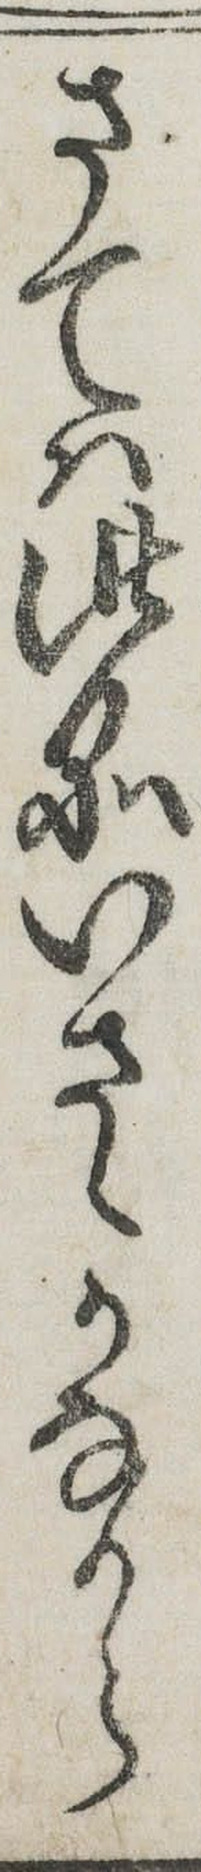さては此品いさゝかなから

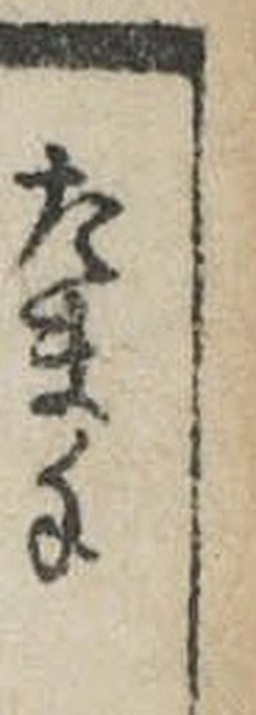たま手
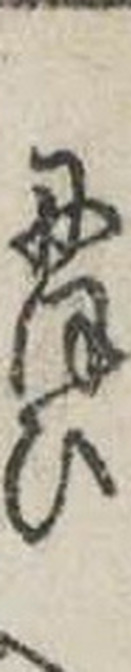にほひ
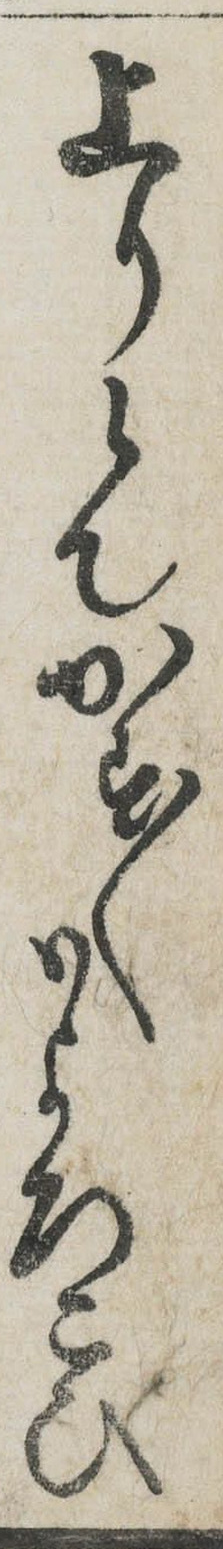上り候てかす〳〵御よろこび
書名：頭書萬用婦人手紙之文言
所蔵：東京学芸大学教育コンテンツアーカイブ
